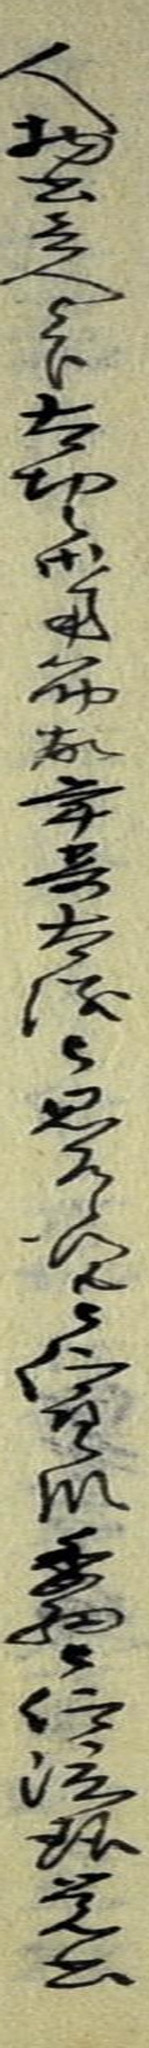人物書壱人被下太切之御用筋故年寄太儀被思召候得共被仰付候段委細被仰渡趣覚書
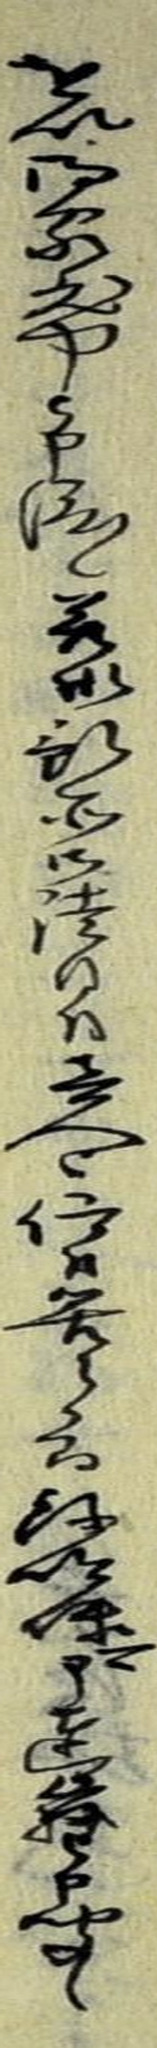を以御家老中被申渡候并御預所御徒目付壱人被仰付筈ニ候間致吟味可申達旨被申聞候
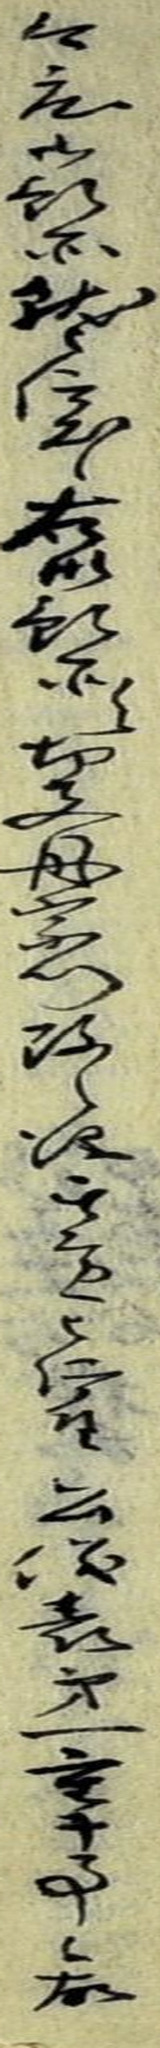今度御預所就被仰出候右御預所之切支丹宗門改之儀其方へ被仰付候公儀表第一重キ事候故
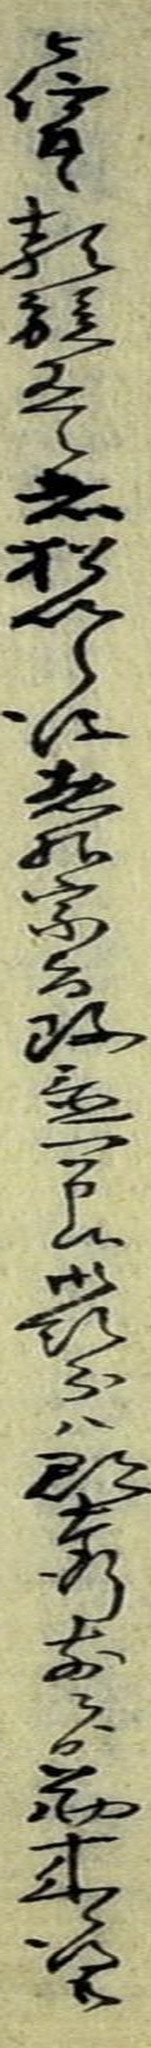被仰付候類族有之者猶以之儀悪様宗旨改置可申候御領分ハ郡奉行前々ゟ勤来候得共
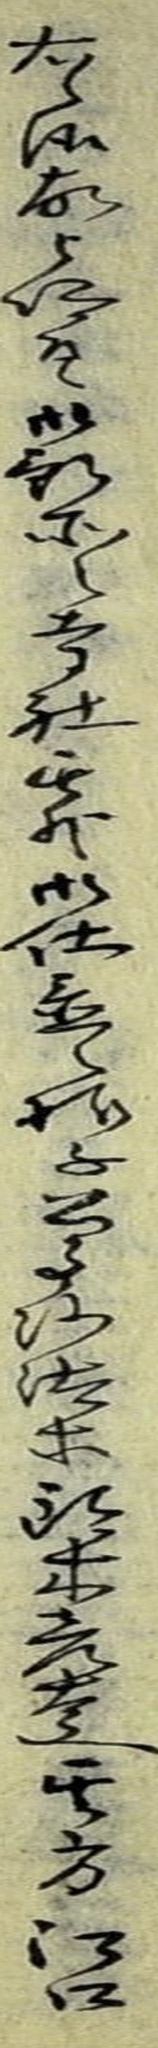右之趣故被仰付候御預所之寺社其外御仕置之様子公事沙汰等鈴木彦大夫其方江口
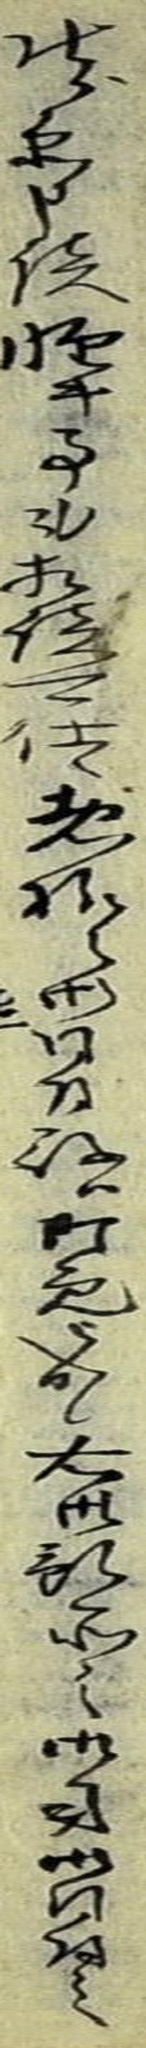次郎兵衛申談軽キ事も相談可仕候悪様之御目付役ハ御免被成候右御預所之御用御目付之
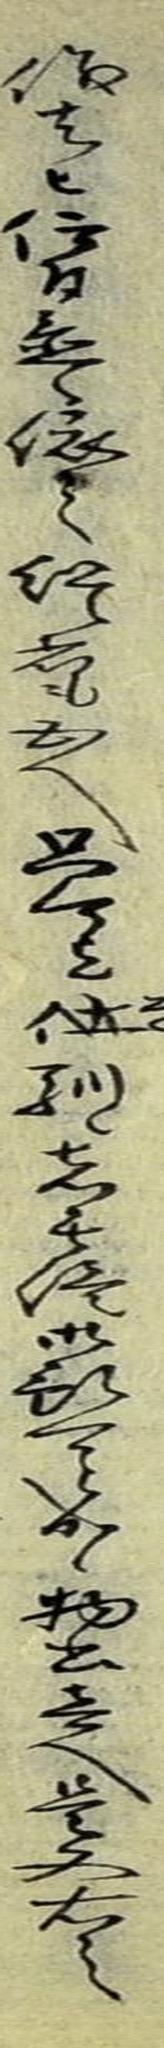儀者被仰付置候依之組之者も五人只今迄仕遣馴候者其儘御預可被成候物書壱人是又右之
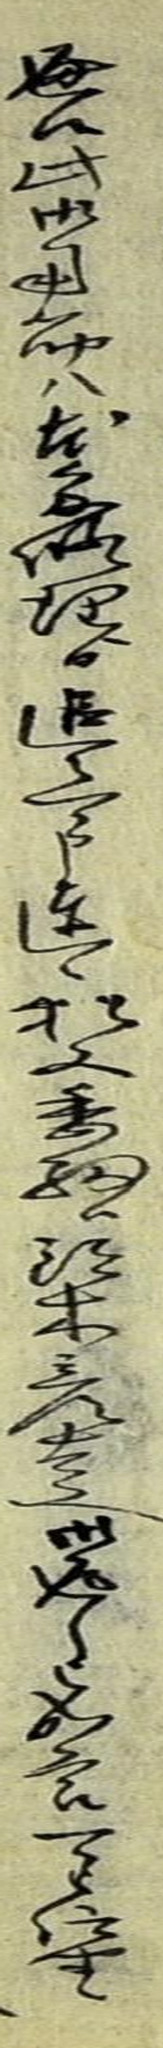通候此御用筋ハ本多修理ゟ追々可申達候猶又委細ハ鈴木彦大夫御返し被成節可被仰聞候
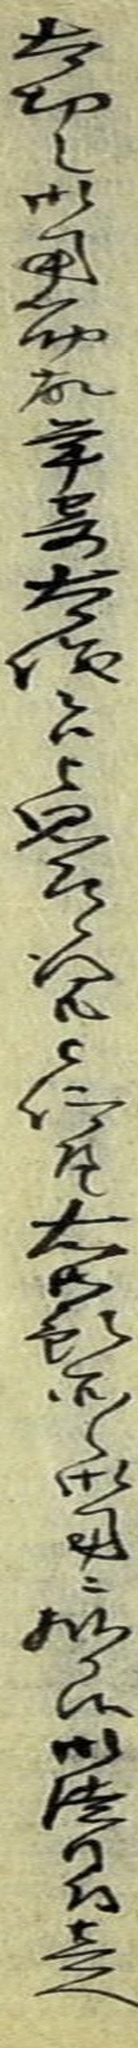太切之御用筋故年寄太儀ニハ被思召候得共被仰付候右御預所之御用ニ掛り候御徒目付壱人
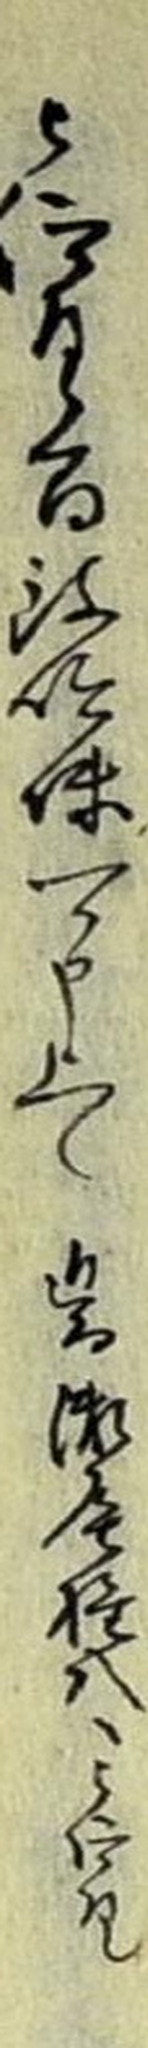被仰付候間致吟味可申上候追而瀬尾権八へ被仰付候
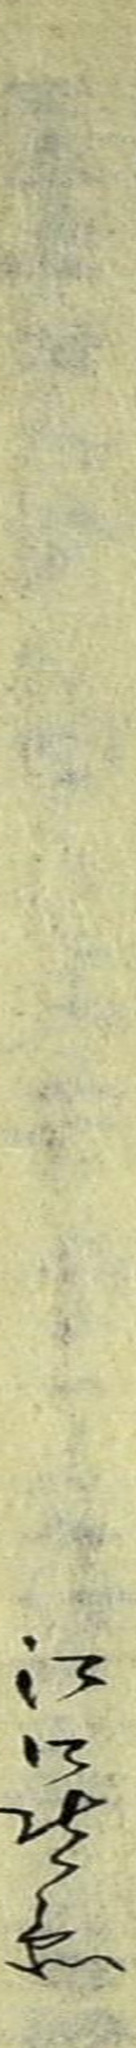江口次郎兵衛
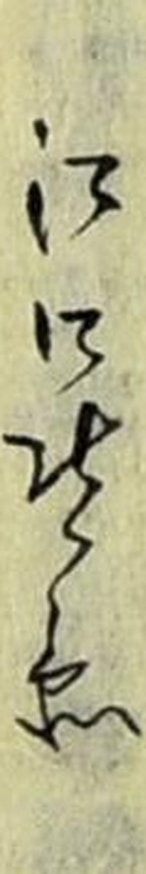江口次郎兵衛
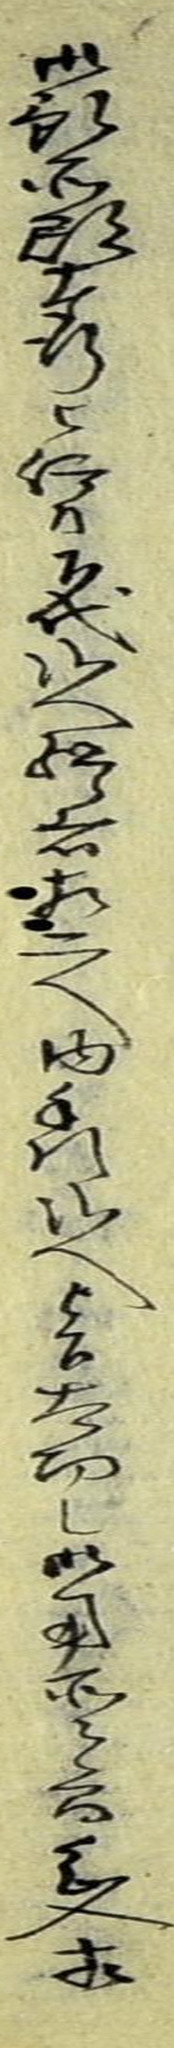御預所郡奉行被仰付下代弐人組之者拾二人内手引弐人被下太切之御用所ニ候間念入相
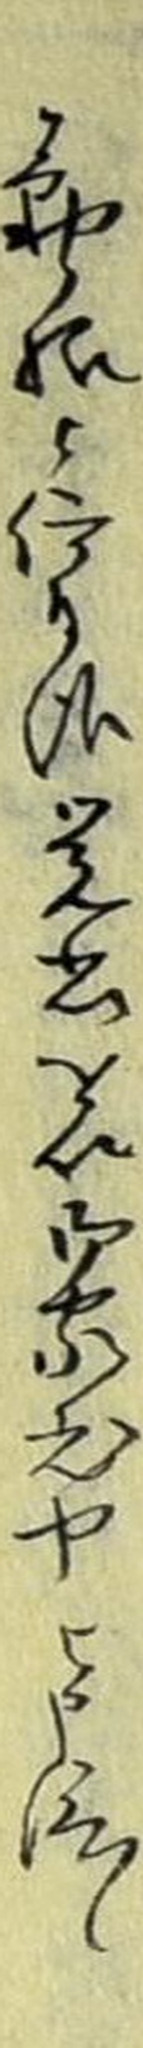勤候様被仰付趣覚書を以御家老中被申渡候

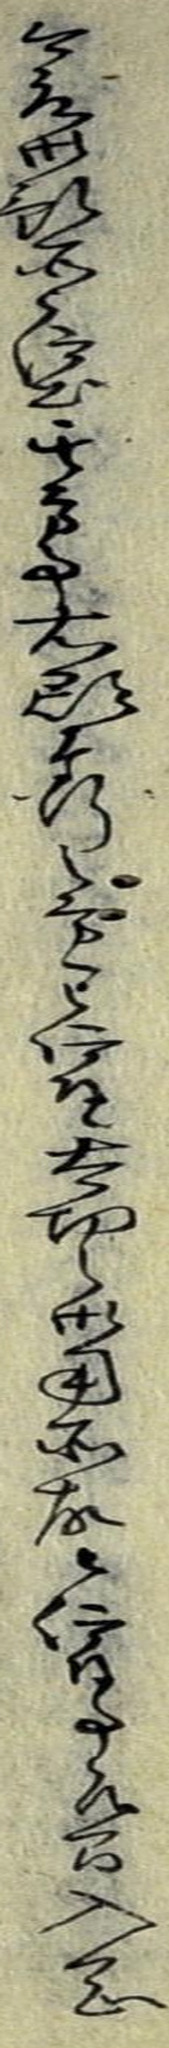今度御預所被仰出其方事右郡奉行之方へ被仰付候太切之御用所故被仰付事ニ候間入念
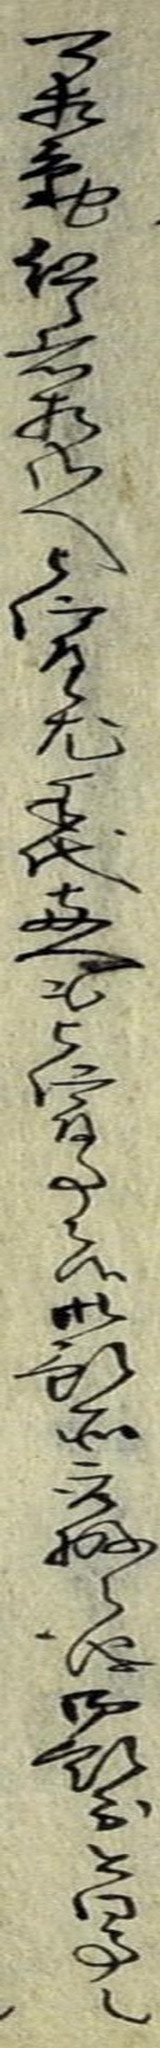可相勤候組之者拾弐人被仰付候尤手代両人も被仰付事ニ候御預所取扱之儀御領分と同事之
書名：命令之部 一
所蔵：福井県文書館 Fukui Prefectural Archives
